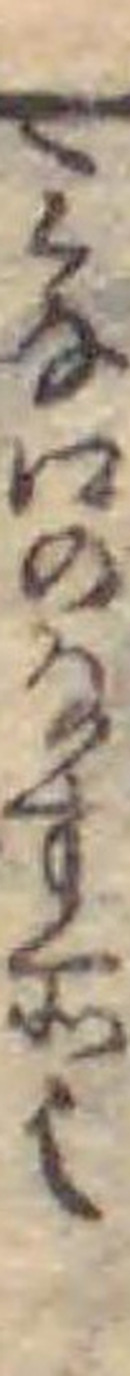みな口のなす所也
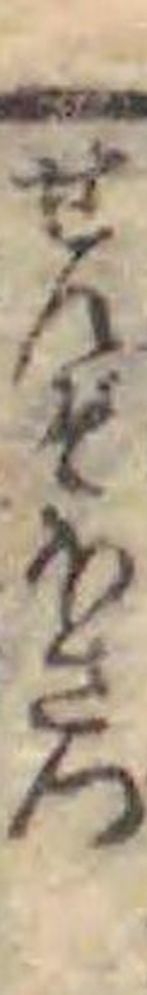せんぞほさつ
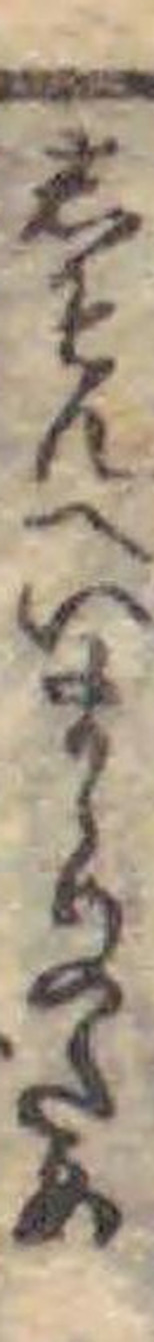しそんへいましめのため
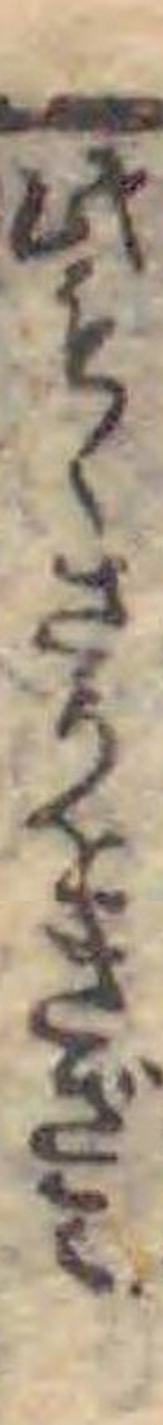此もくさうをきざみ
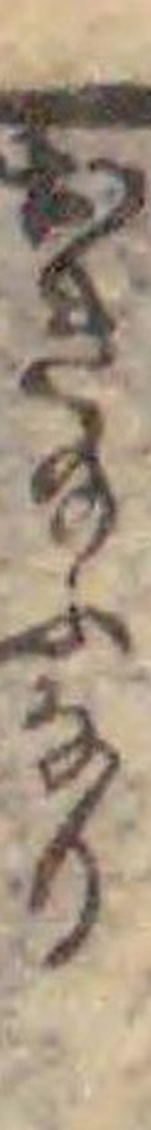おき給ふなり
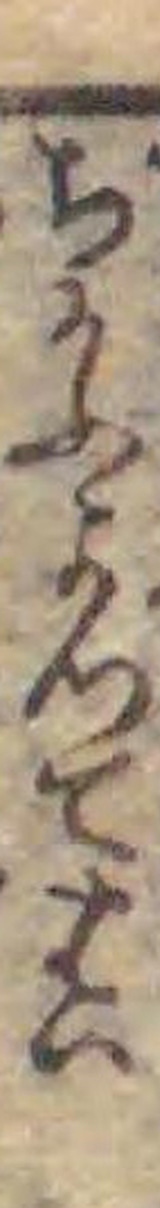ちかふよつてはい
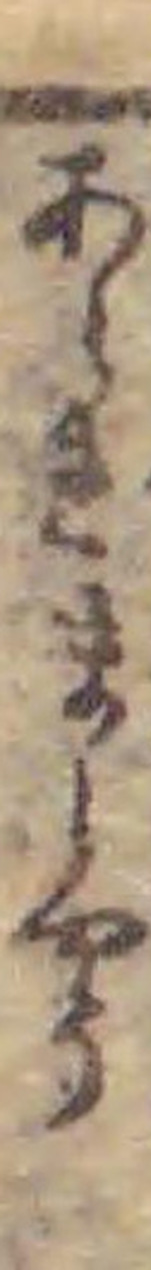あられましやう

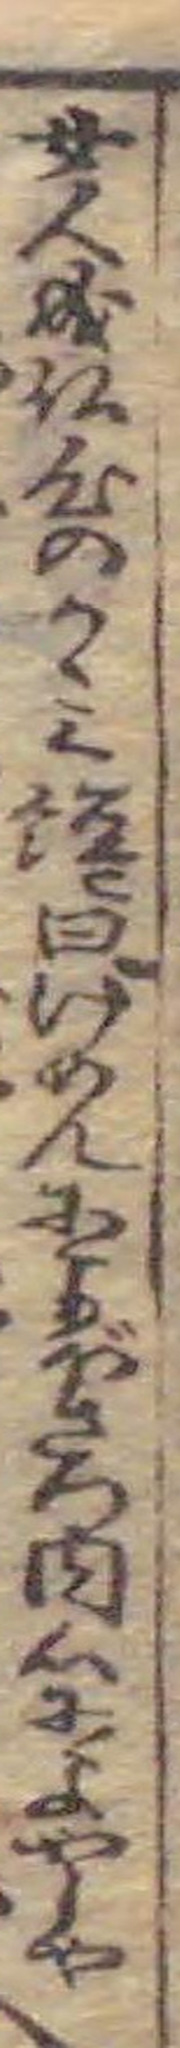女人成仏心のかゝみ絵に曰げめんによぼさつ内心によやしや云
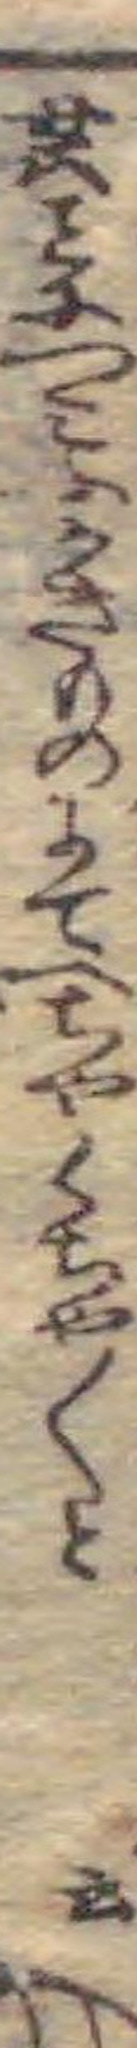女はことにつみかきものにてへちやくちや〳〵と
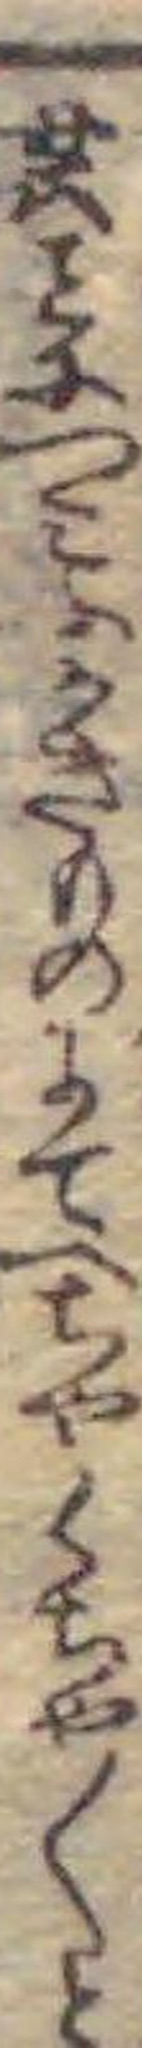女はことにつみかきものにてへちやくちや〳〵と
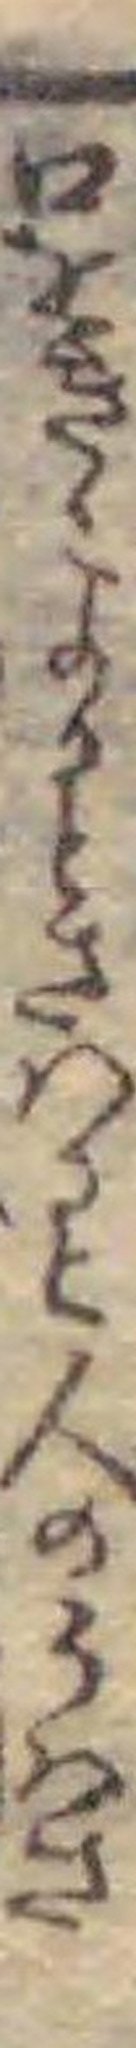口をきゝよるとさはると人のうはさ
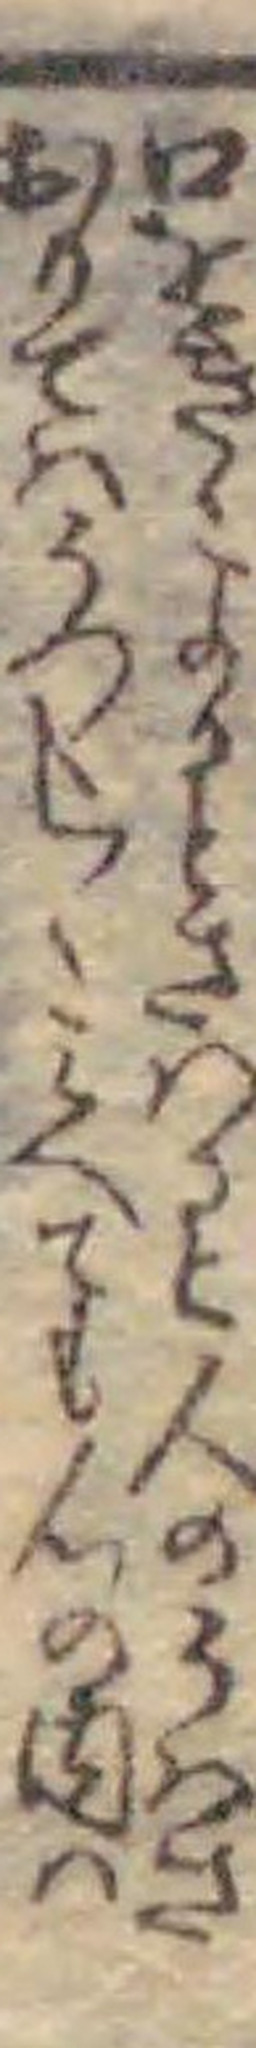おもてはうつくしくみへても心の内は
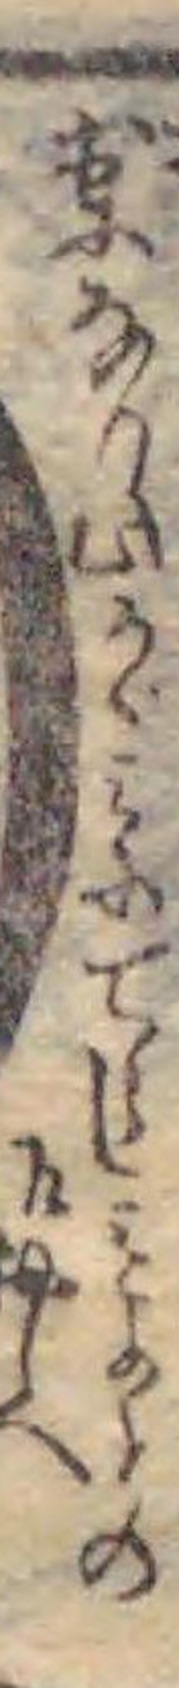おになり此かゞみにてらしみよとの
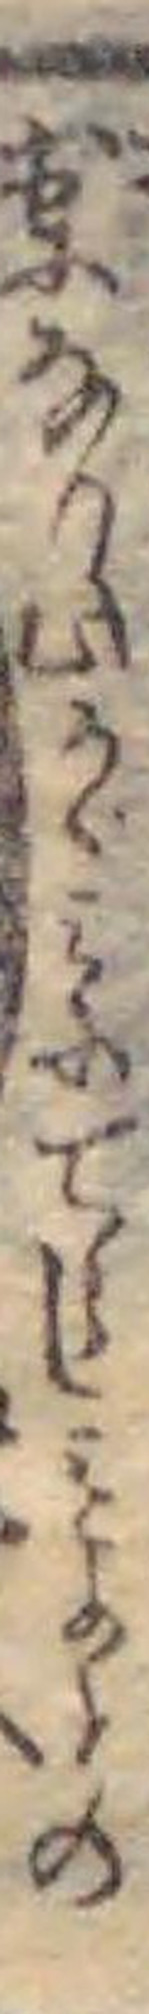おになり此かゞみにてらしみよとの
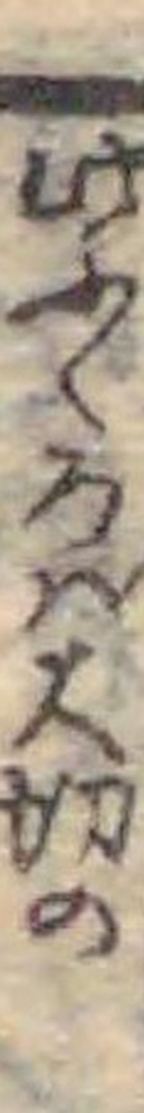此ふくろは大切の
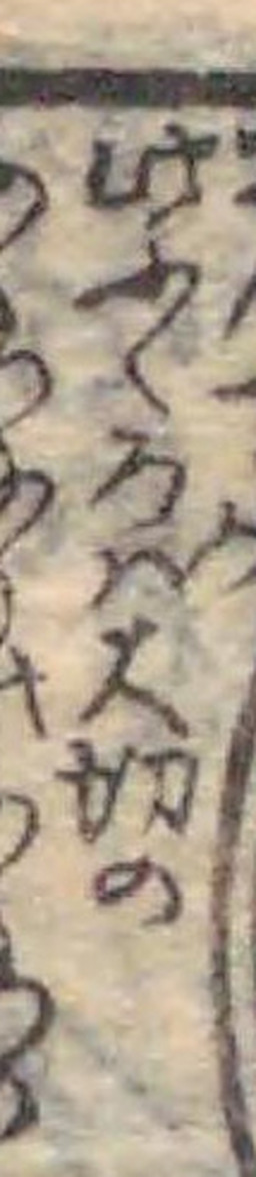ふくろなり此ふくろの
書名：身体開帳略縁起 : 3巻
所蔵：国立国会図書館 National Diet Library, JAPAN
